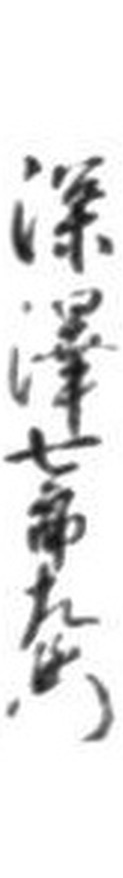深沢七郎左衛門
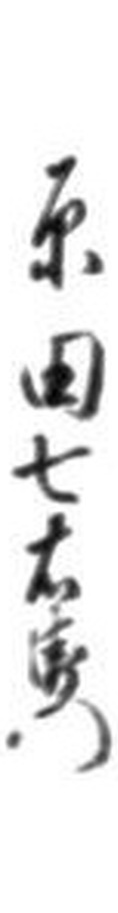原田七右衛門
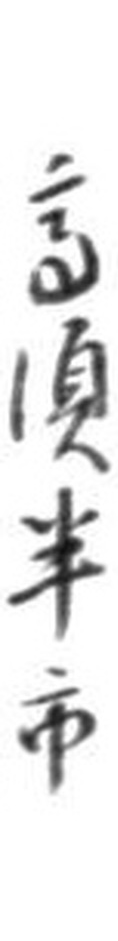高須半市
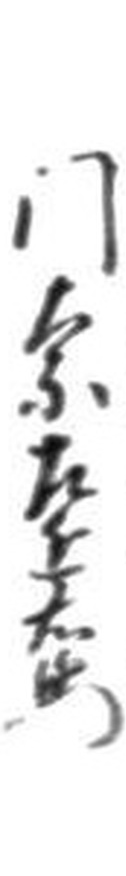門奈左近右衛門
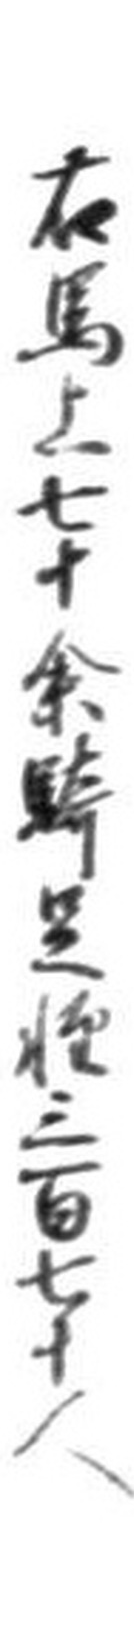右馬上七十余騎足軽三百七十人
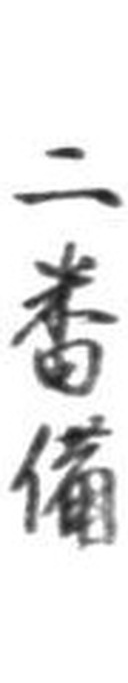二番備
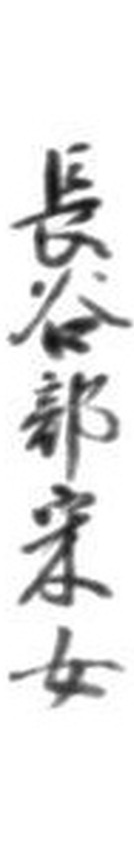長谷部采女
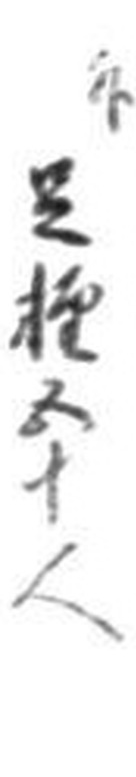足軽五十人
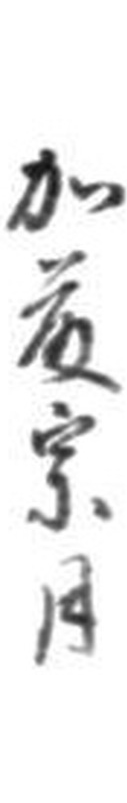加藤宗月
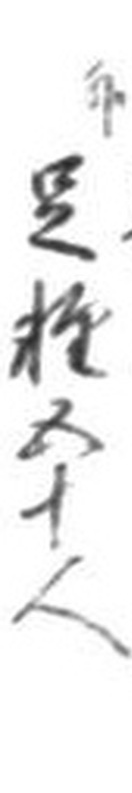足軽五十人

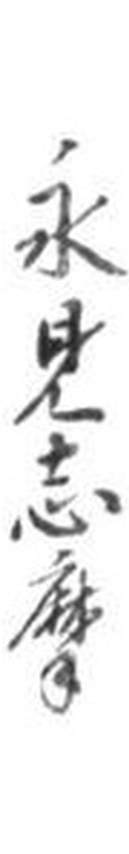永見志摩
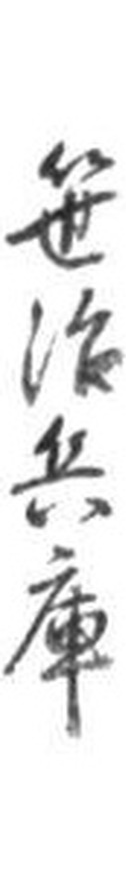笹治兵庫
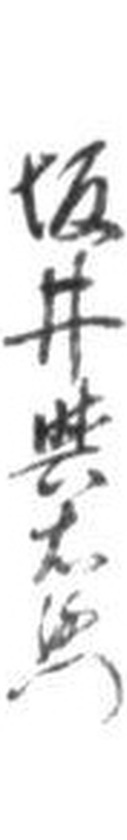坂井与右衛門
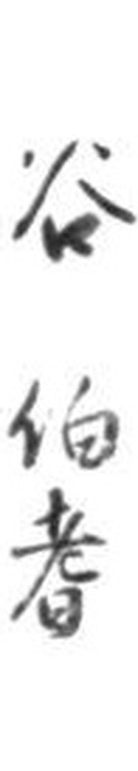谷伯耆
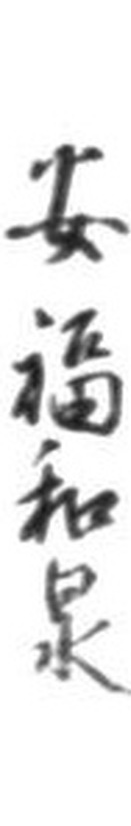安福和泉
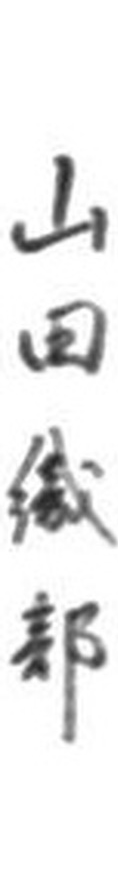山田織部
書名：家譜 二 忠直公 従文禄四年到慶安四年
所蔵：福井県文書館 Fukui Prefectural Archives
